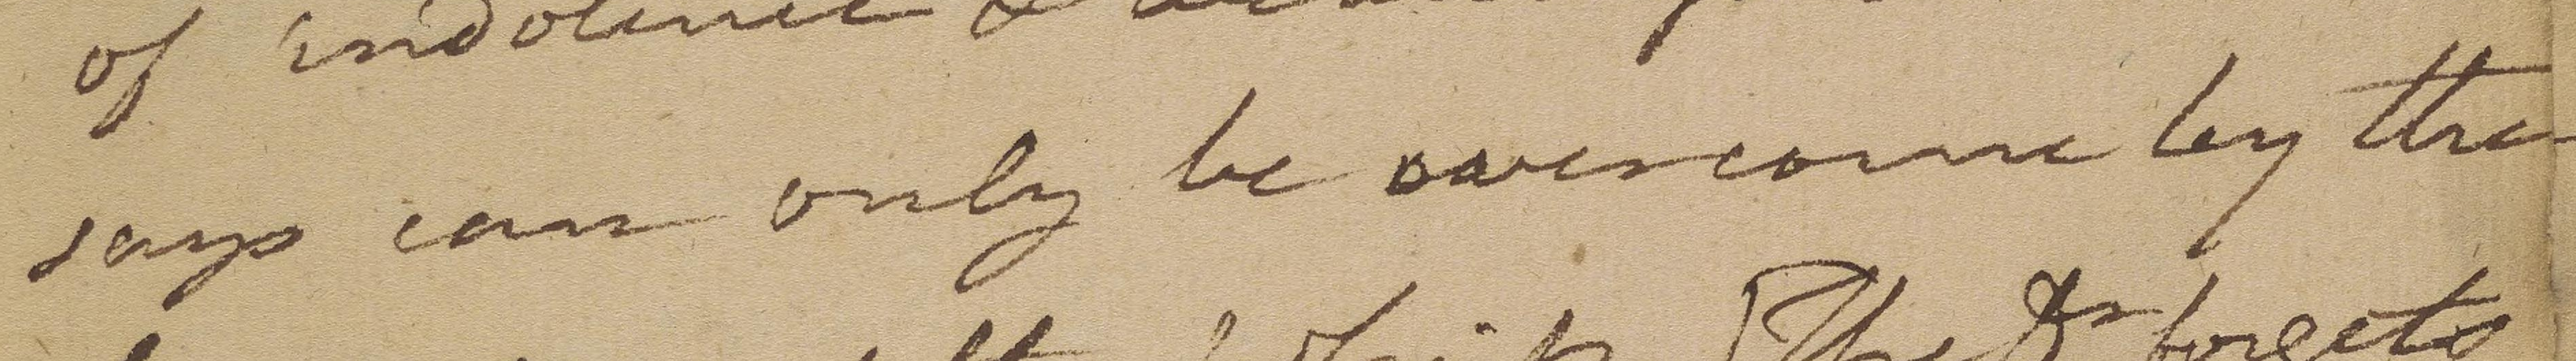says can only be overcome by the
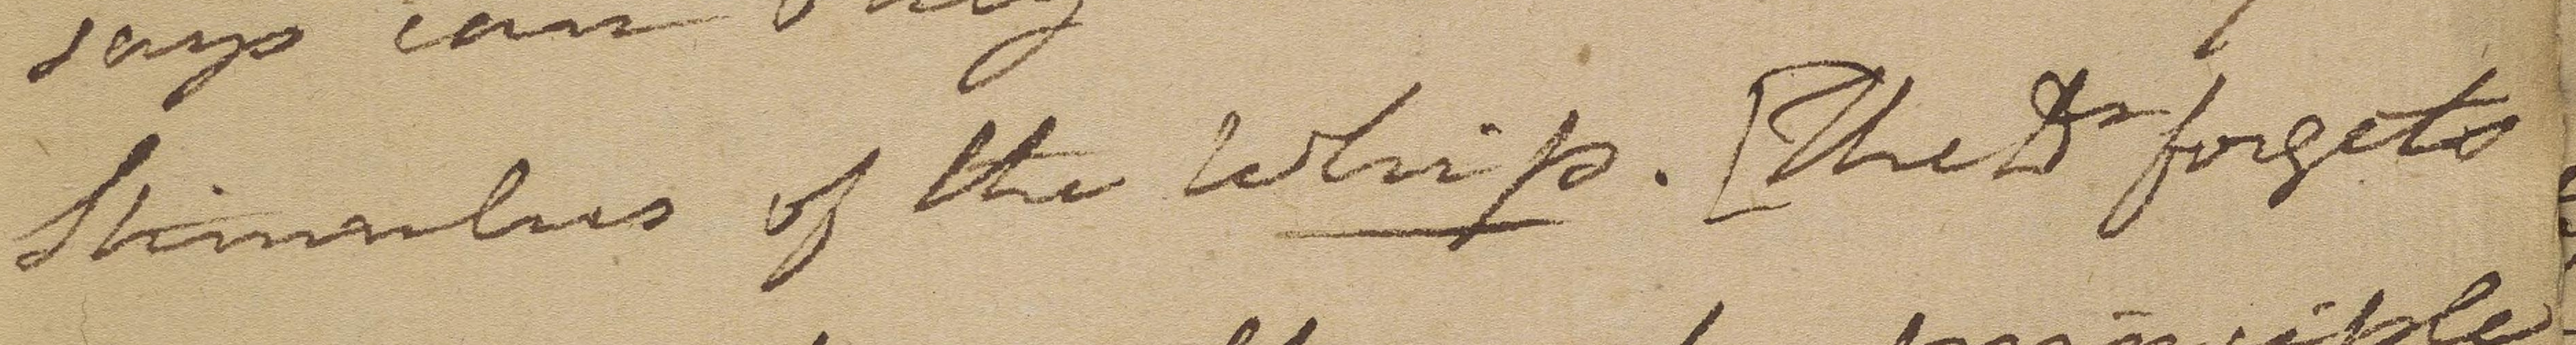stimulus of the whip. (The D^r forgets
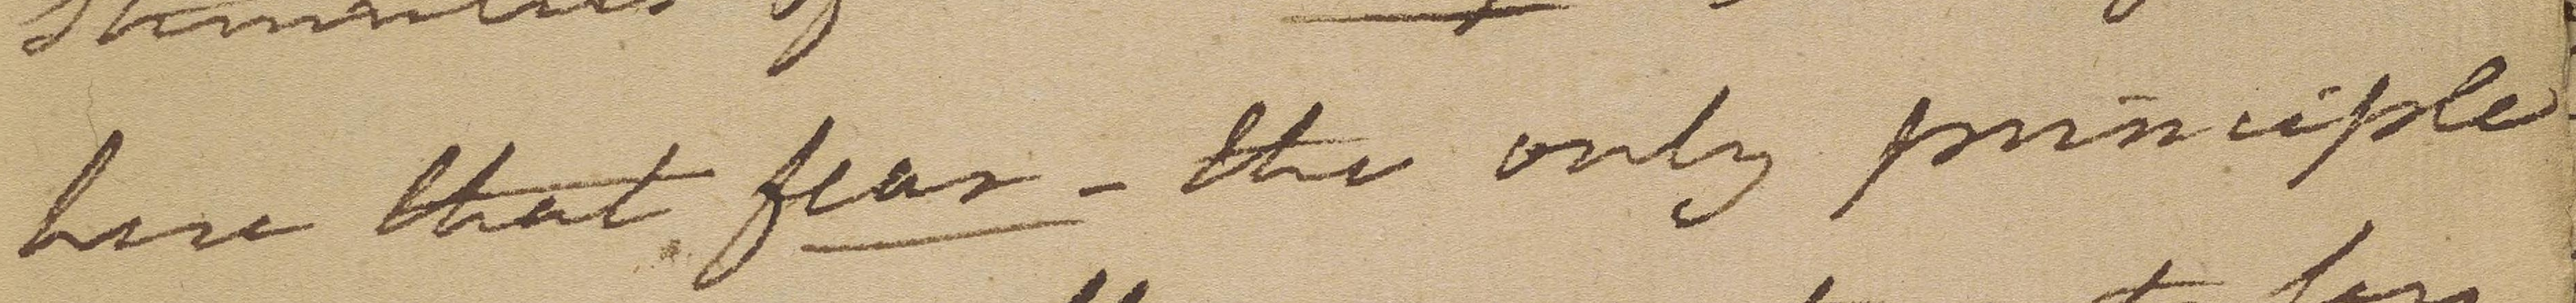here that fear, the only principle
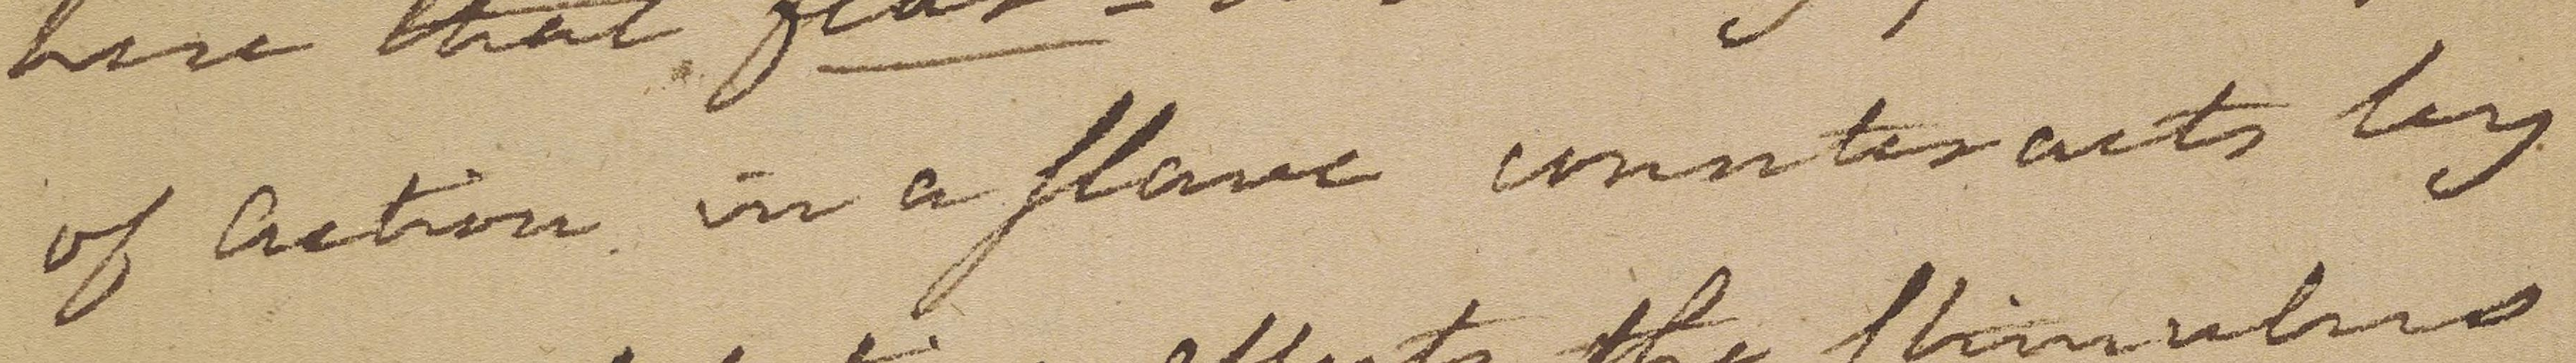of action in a slave counteracts by
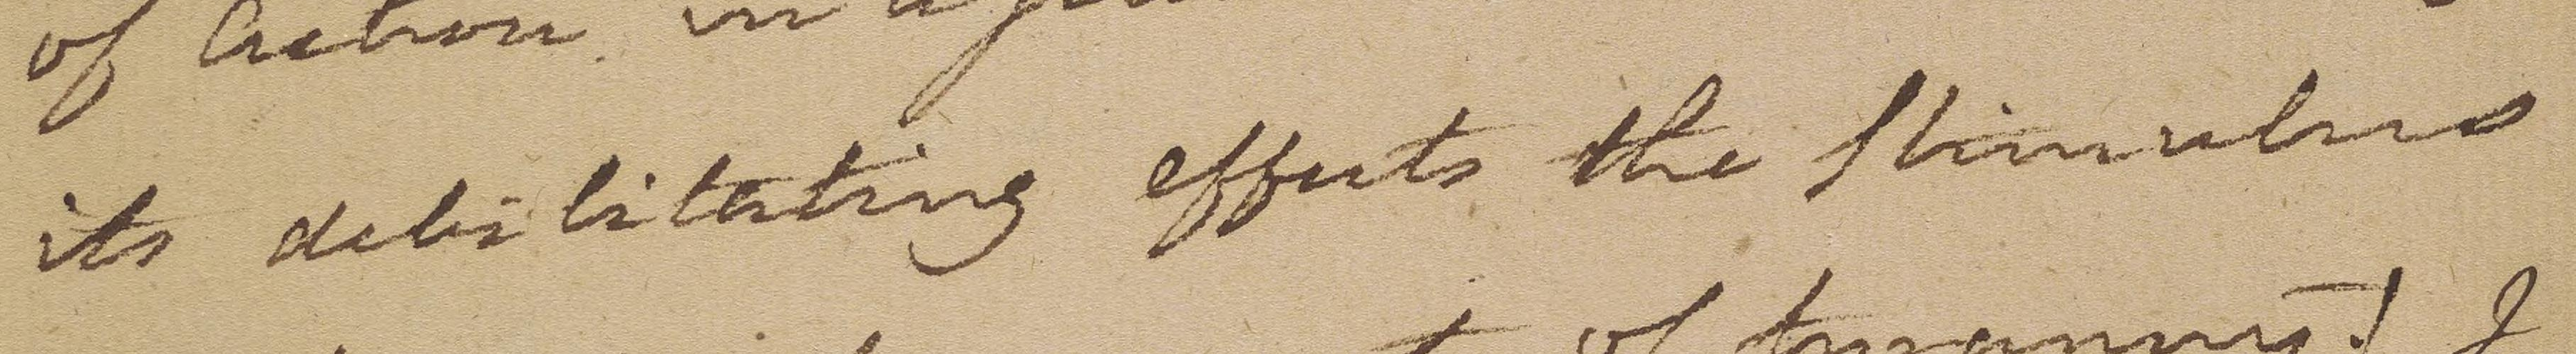its debilitating effects the stimulus
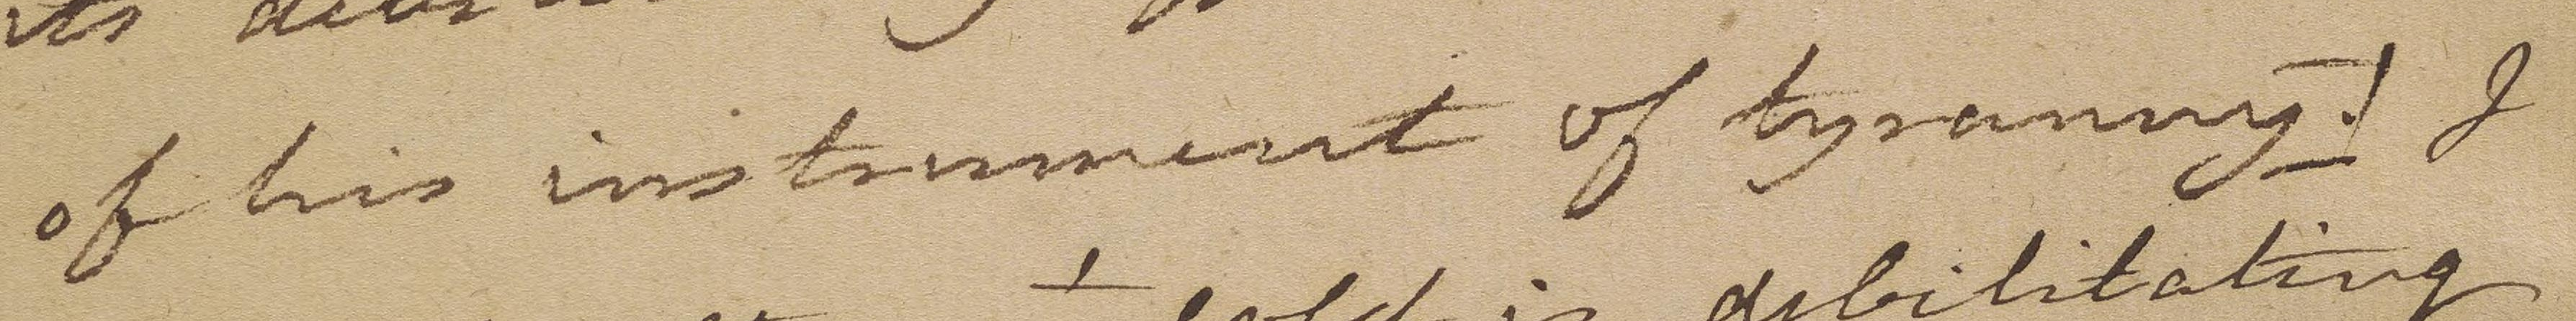of his instrument of tyranny.) I
